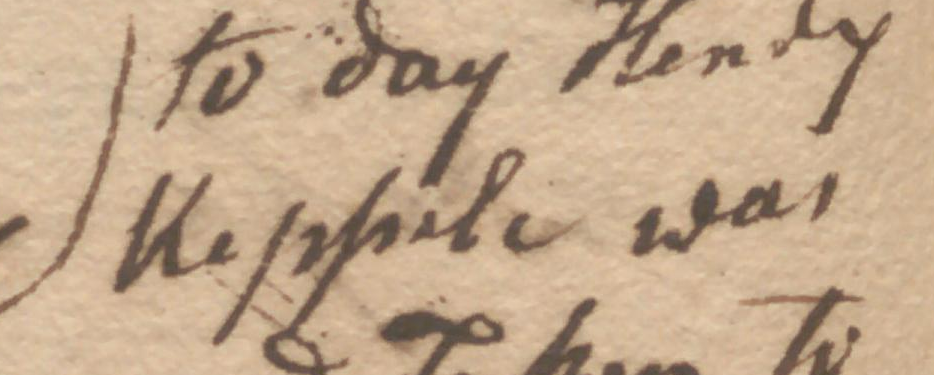Keppele
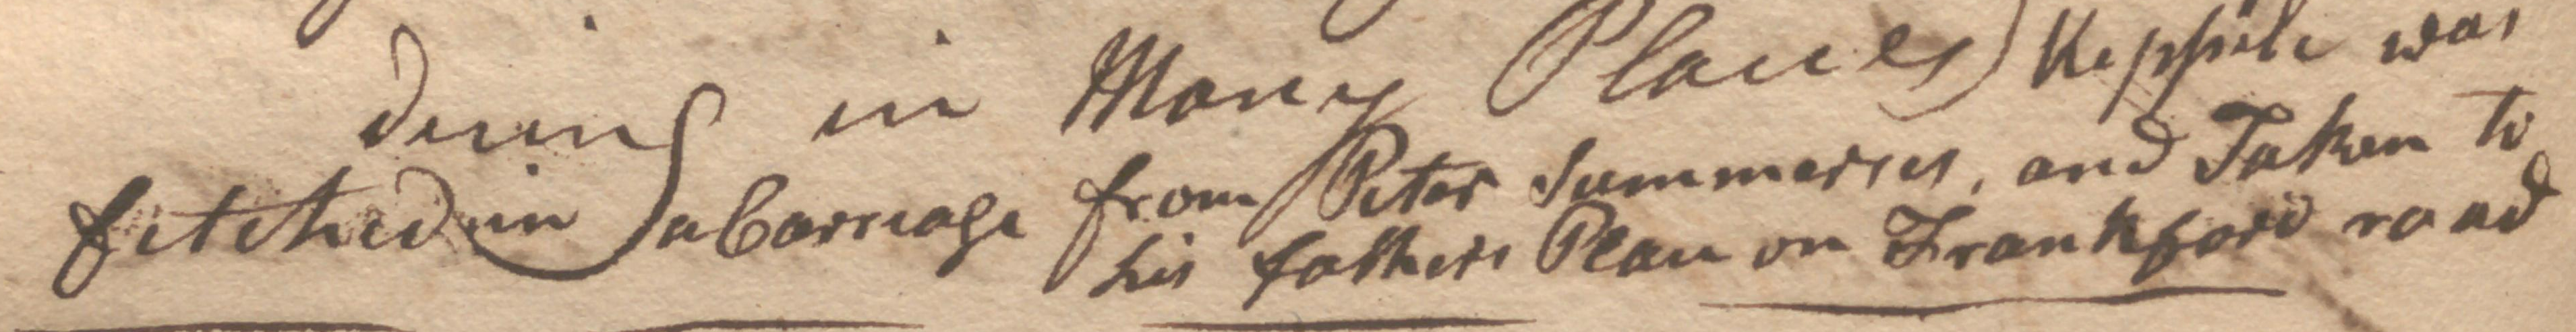fetched in a Carriage from Peter Summerses, and Taken to
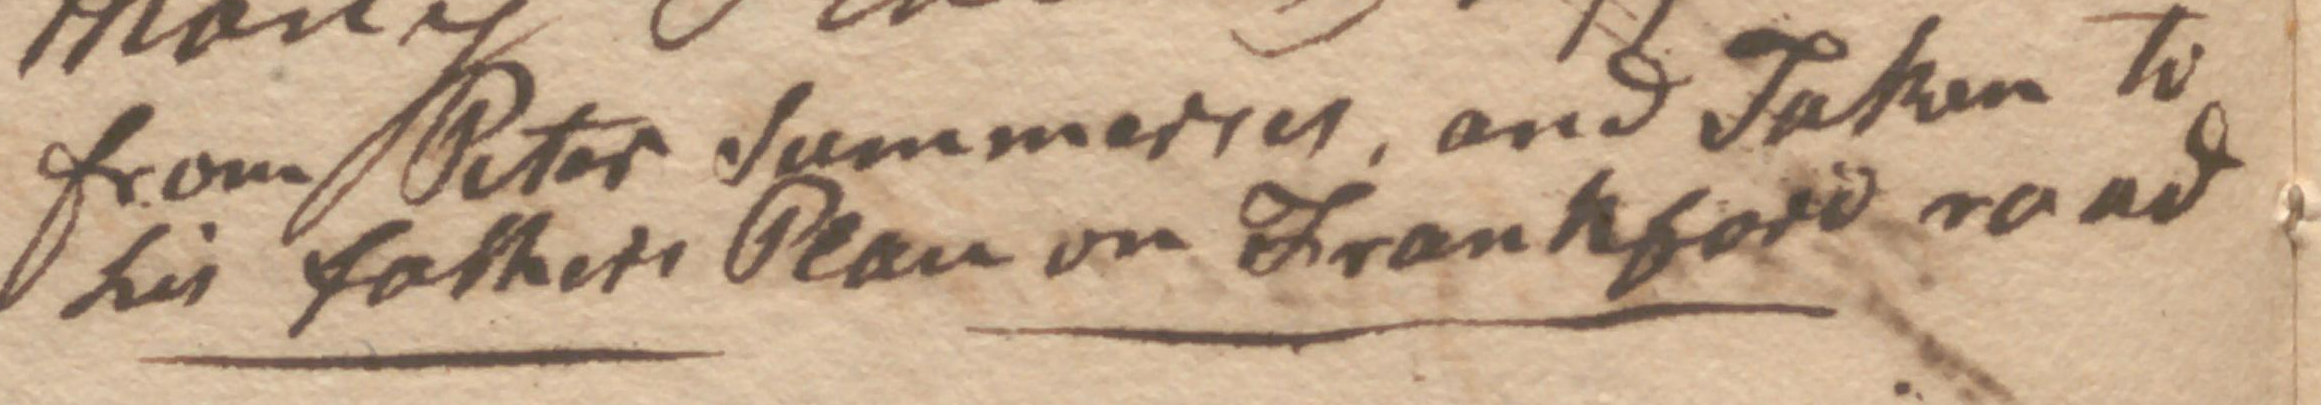his fathers Place on Frankford road
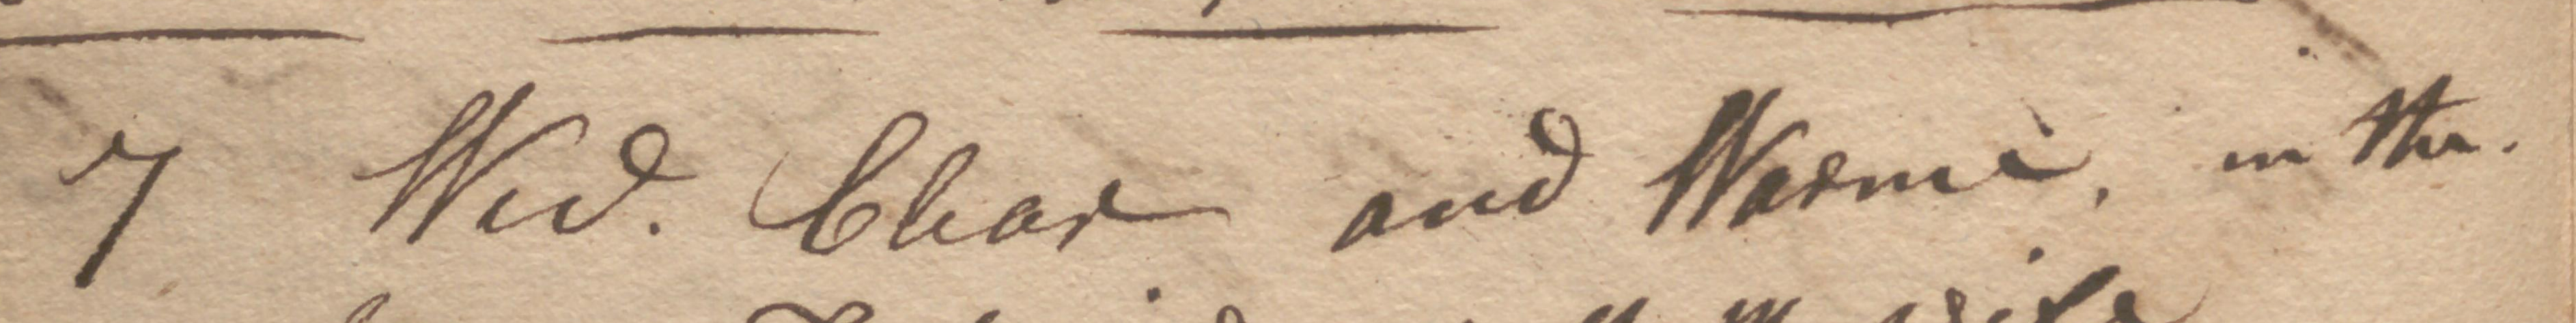7 Wed. Clear and Warme, in the
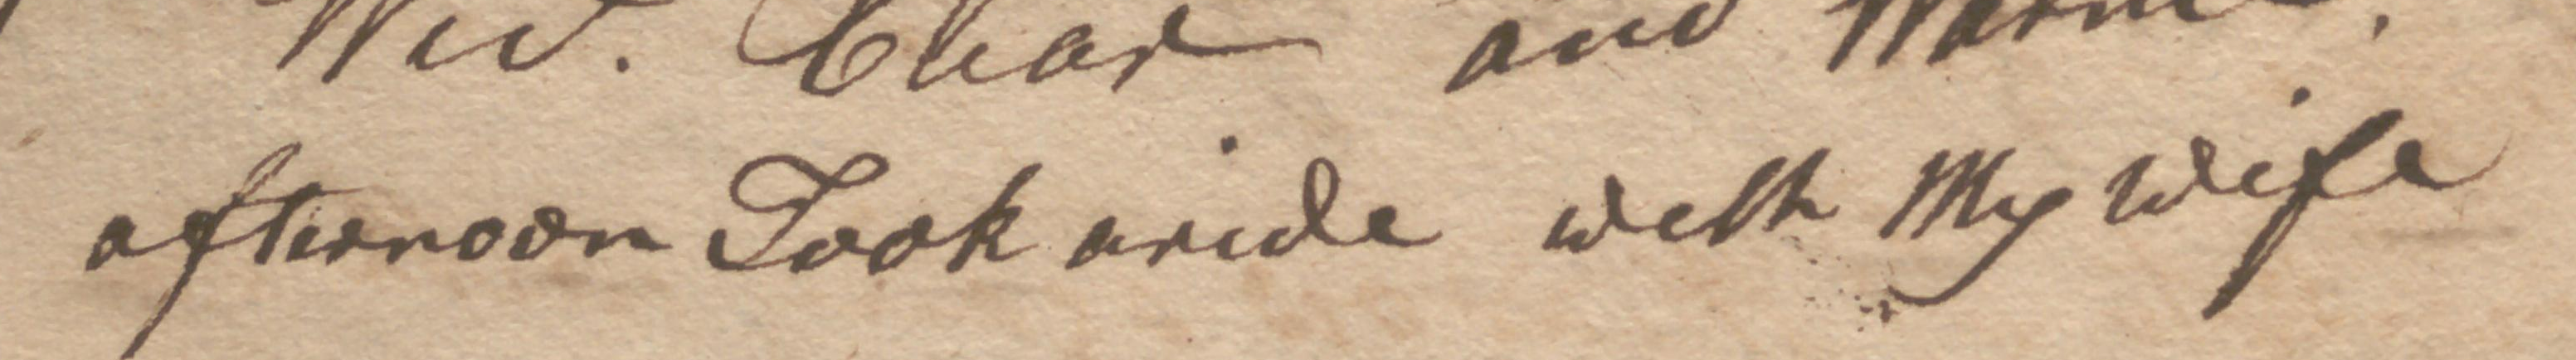afternoon Took a ride with My wife
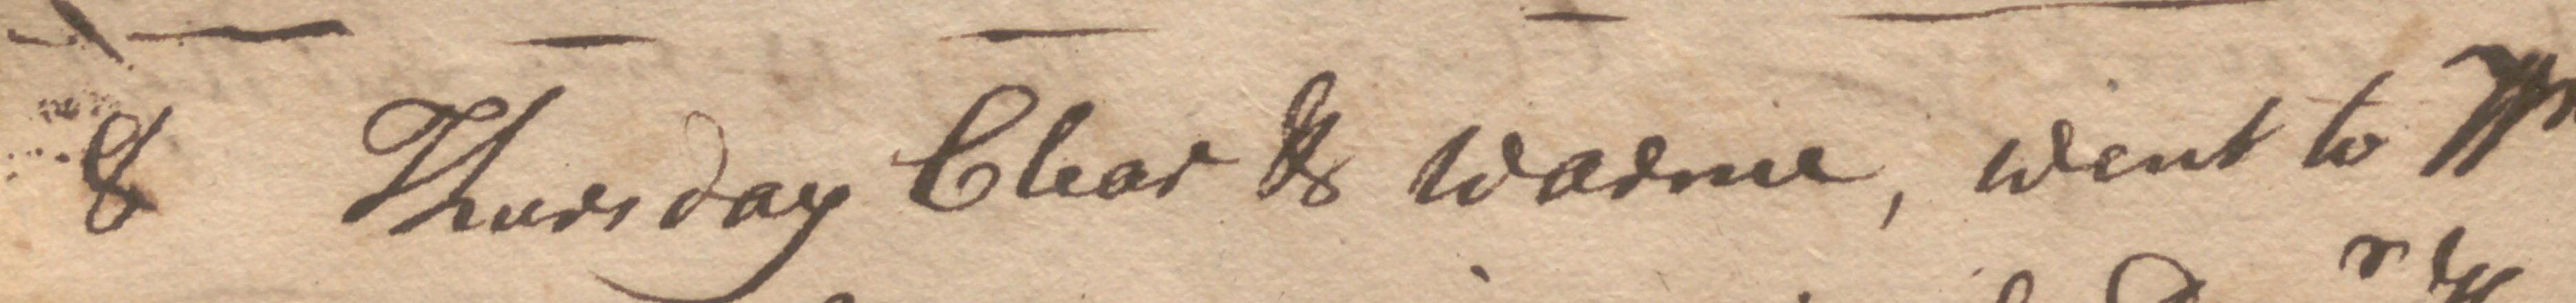8 Thursday Clear & warme, went to W^m.
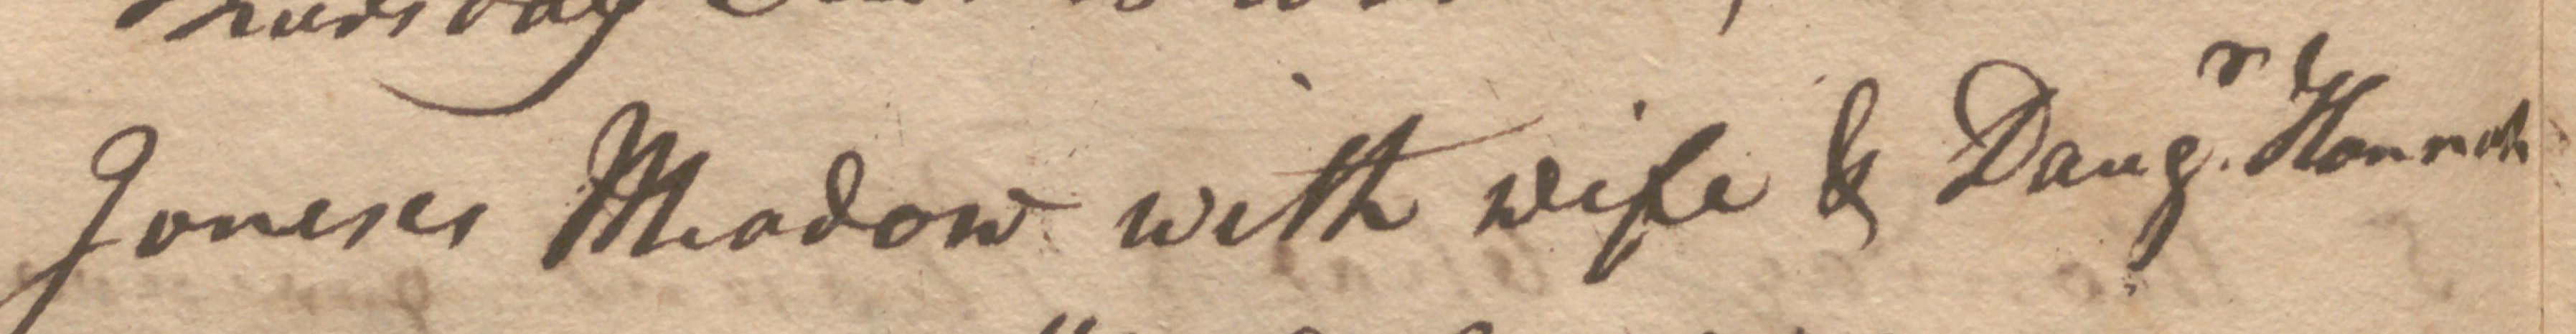Joneses Meadow with wife & Daug^r. Hannah
